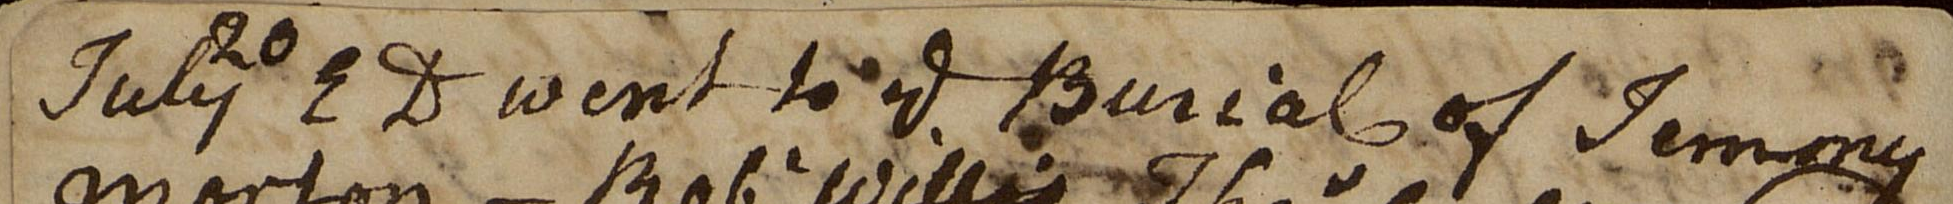July^20 ED went to y^e Burial of Jemmy
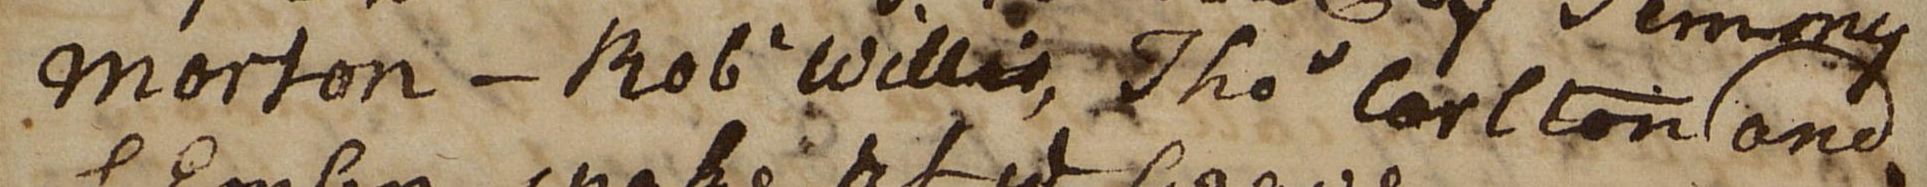Morton- Rob^t Willis, Tho^s Carlton and
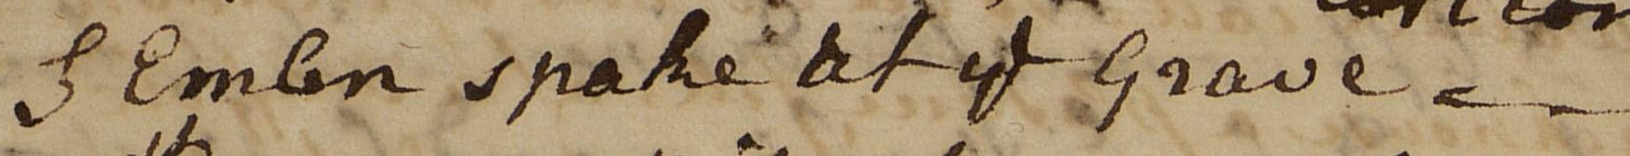S Emlen spake at y^e Grave-
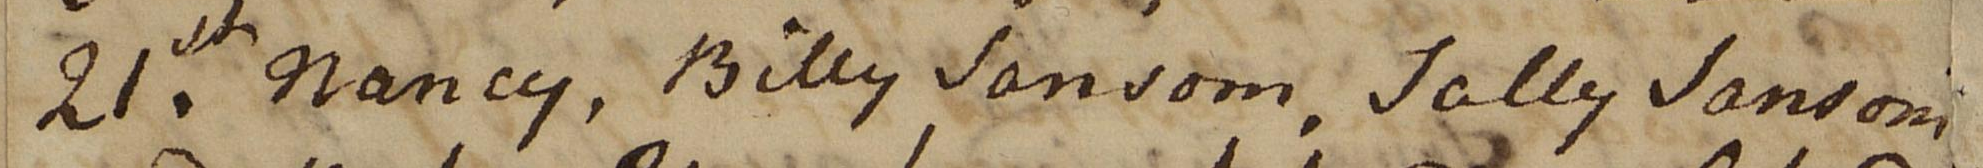21^st. Nancy, Billy Sansom Sally Sansom
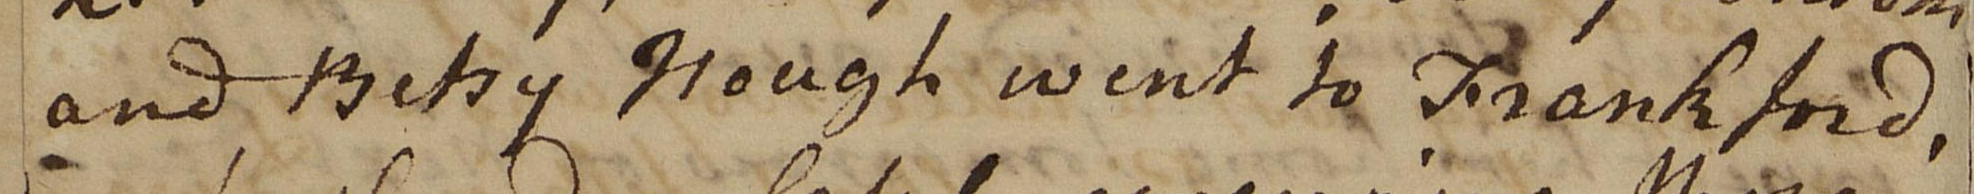and Betsy Hough went to Frankford,
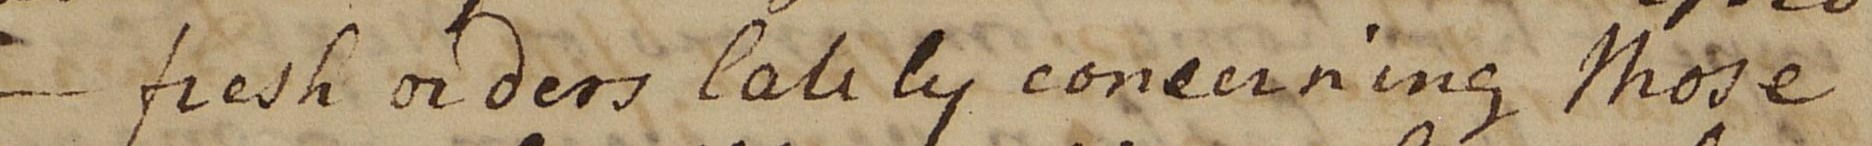-fresh orders lately conserning those
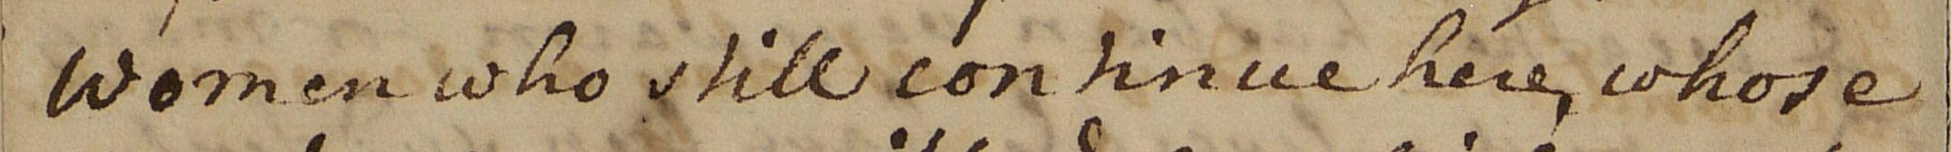Women who still continue here, whose
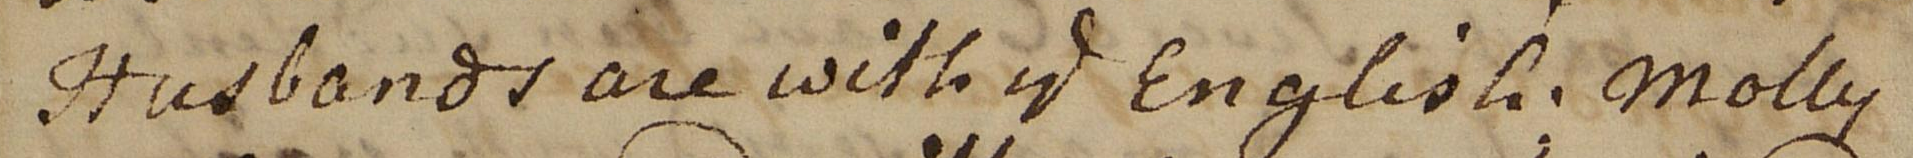Husbands are with y^e English. Molly
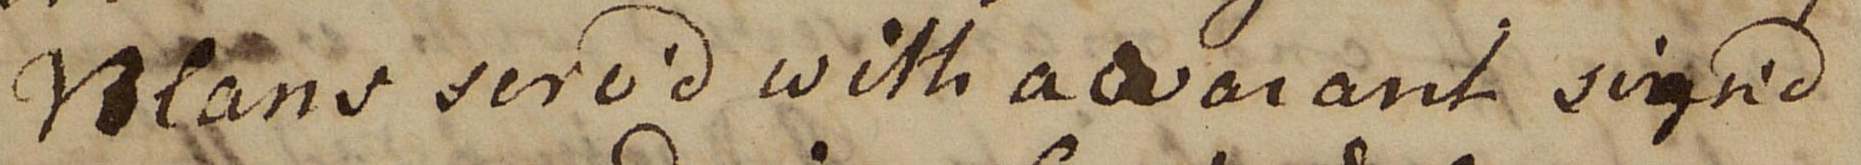Blans serv'd with a warant sign'd
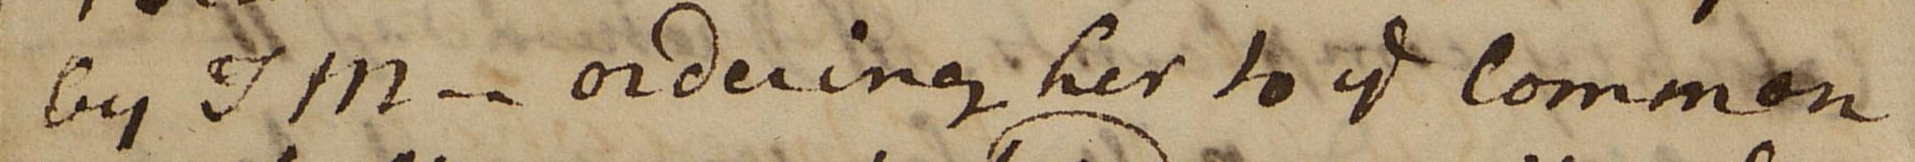by TM- ordering her to y^e Common
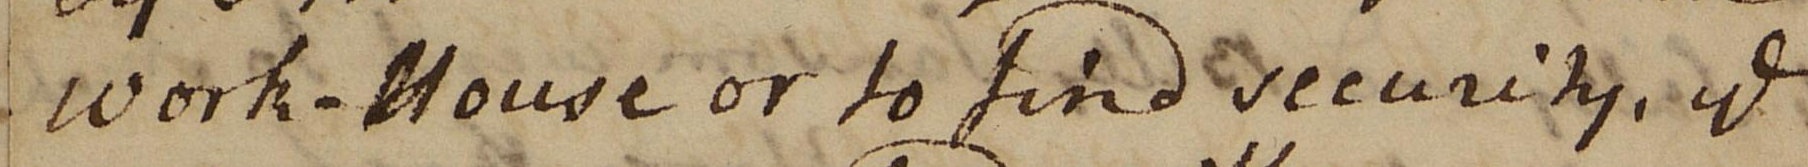work-House or to find security, y^e
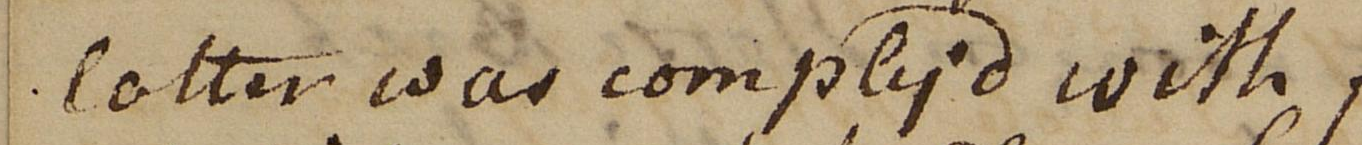latter was comply'd with
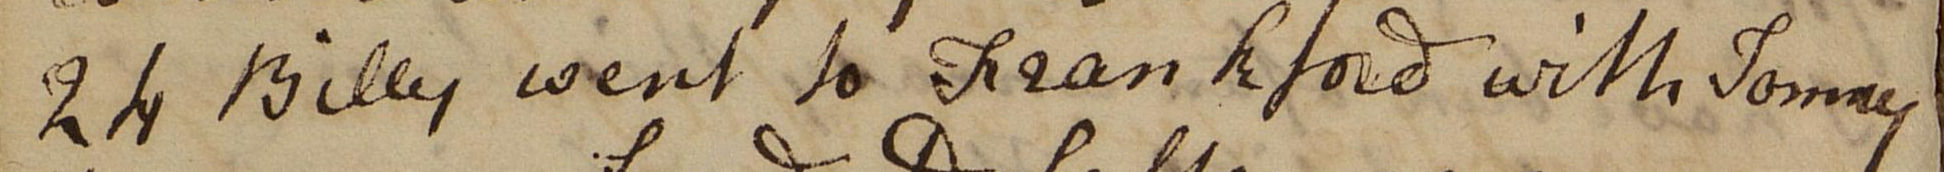24 Billy went to Frankford with Tomny
